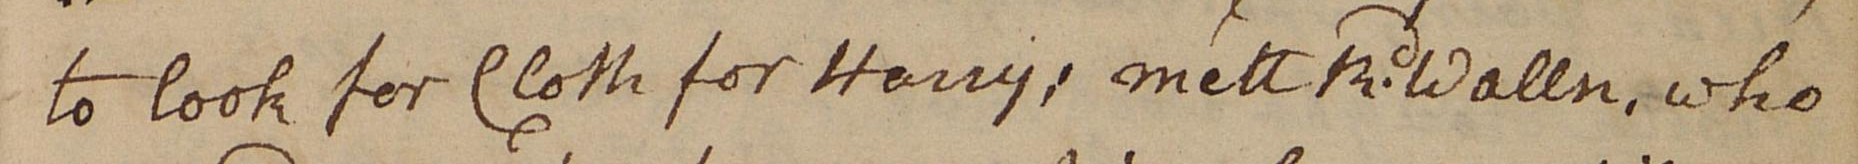to look for Cloth for Henry; mett R^d. Walln, who
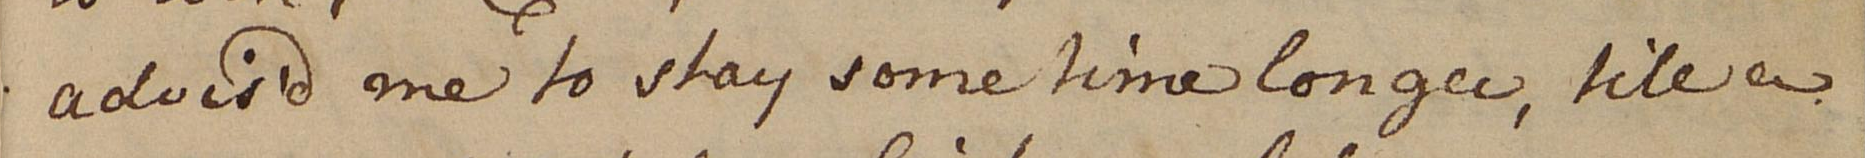advis'd me to stay some time longer, till a
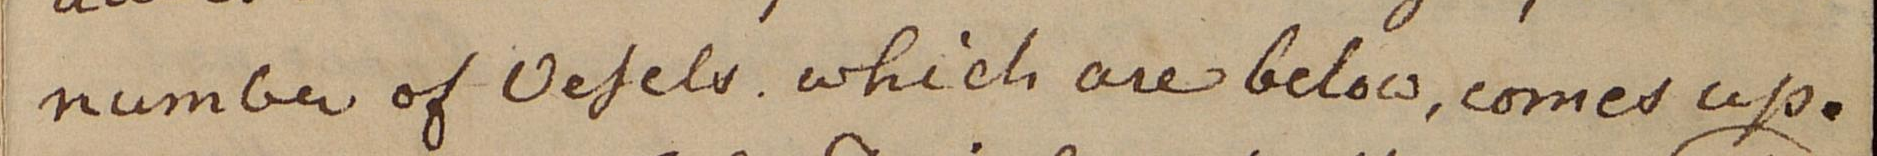number of Vesels which are below, comes up.
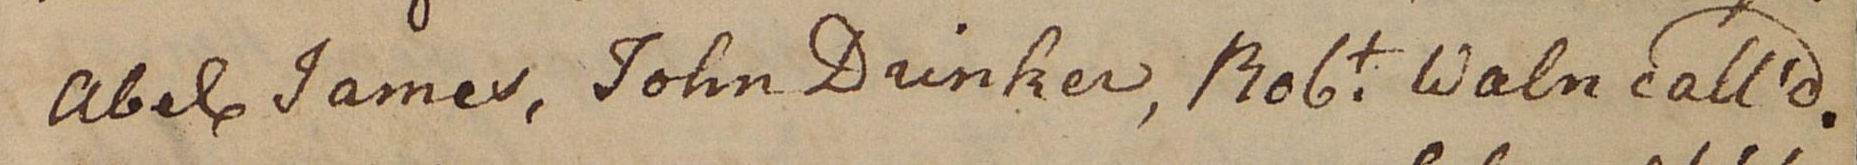Abel James, John Drinker, Rob^t. Waln call'd.
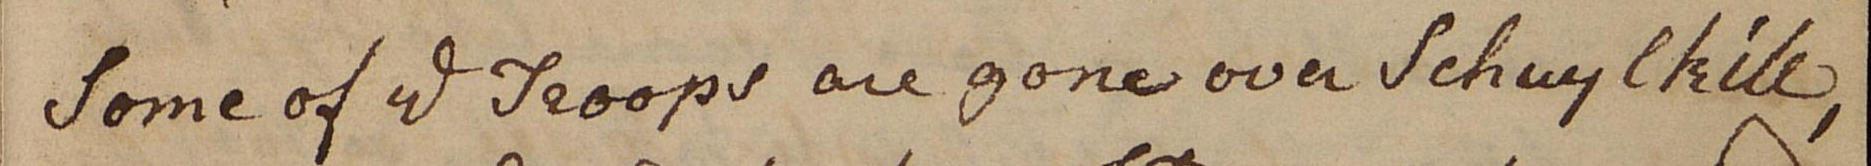Some of y^e Troops are gone over Schuylkill,
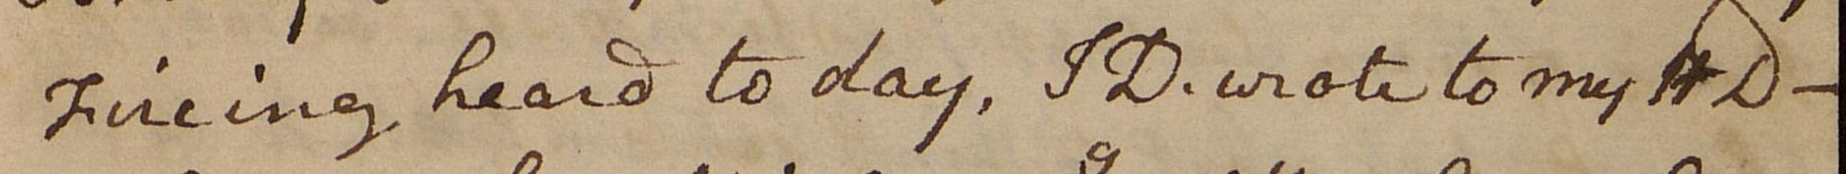Fireing heard to day, JD. wrote to my HD-
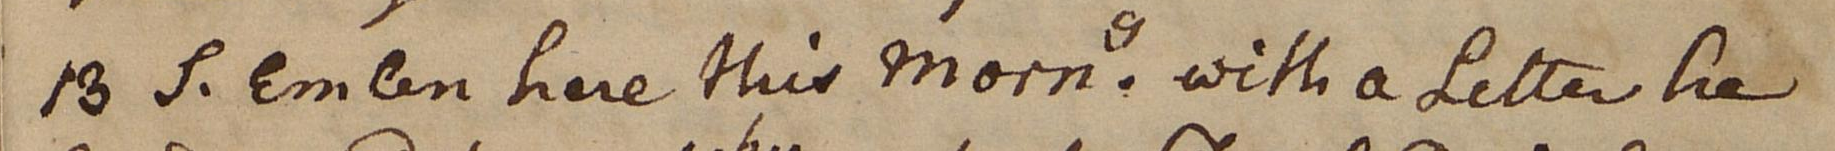13 S. Emlen here this Morn^g. with a Letter he
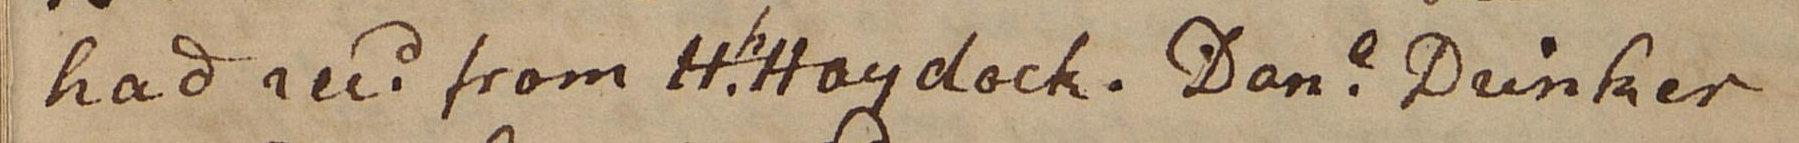had rec^d. from H^h. Haydock. Dan^l. Drinker
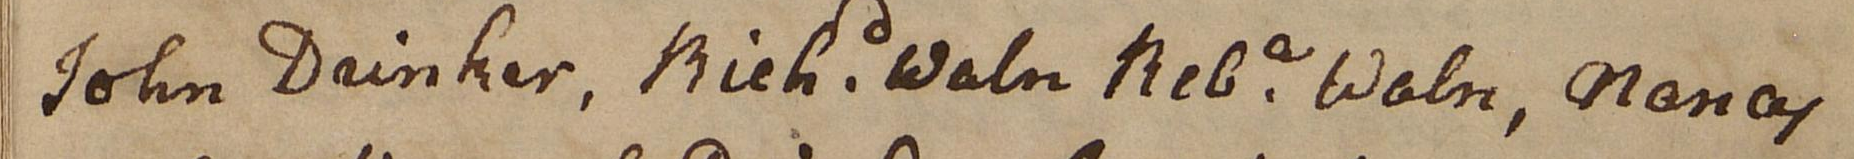John Drinker, Rich^d. Waln Reb^a Waln, Nancy
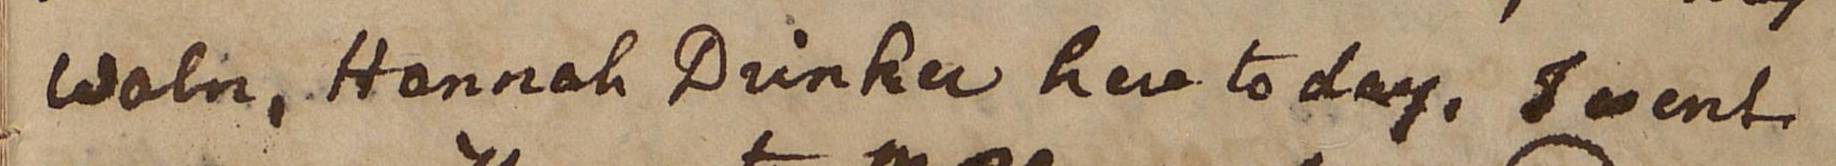Waln, Hannah Drinker here to day, I went
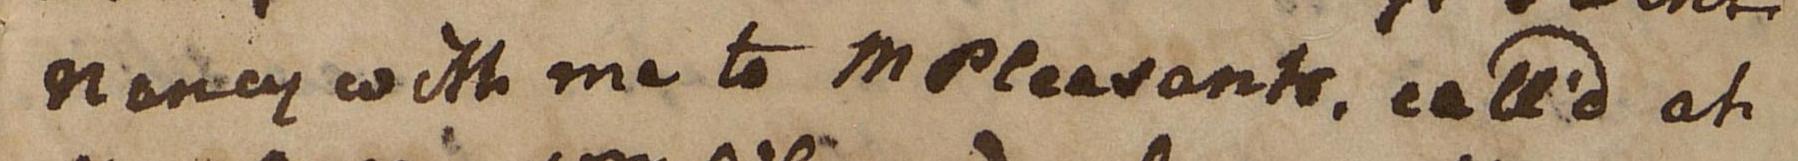Nancy with me to M Pleasants, call'd at
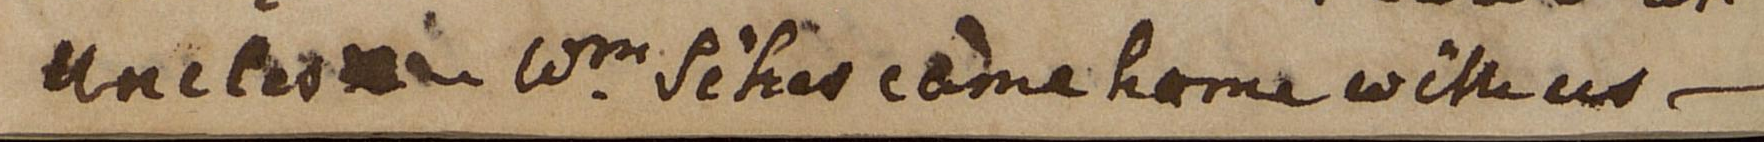Uncles [_]- W^m. Sikes came home with us-
